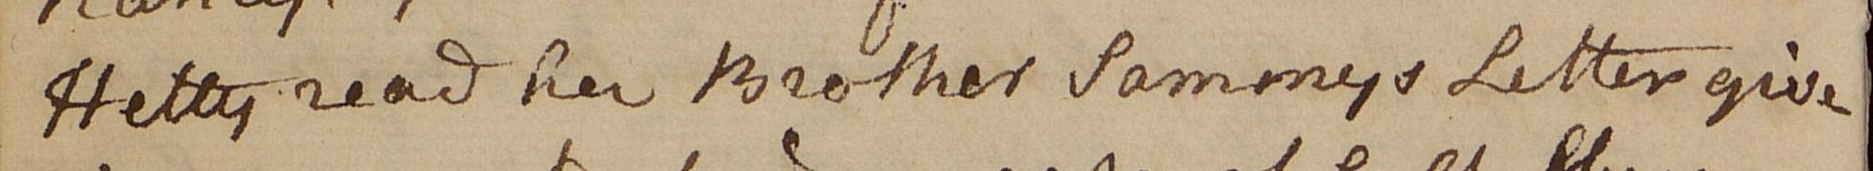Hetty read her Brother Sammys Letter give
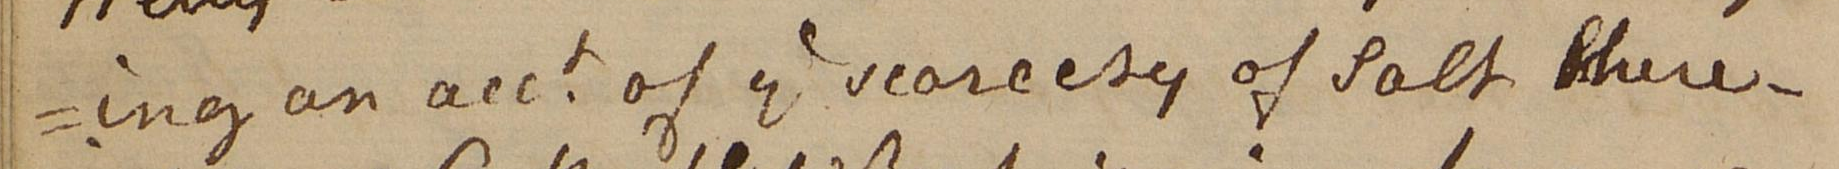-ing an acc^t. of y^e scarcety of salt there-
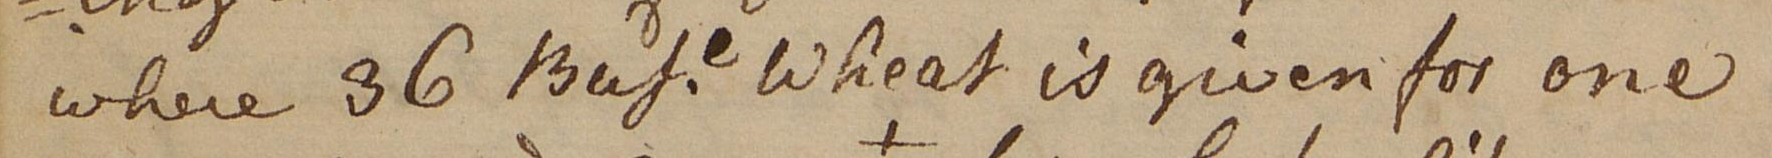where 36 Bus^l. Wheat is given for one
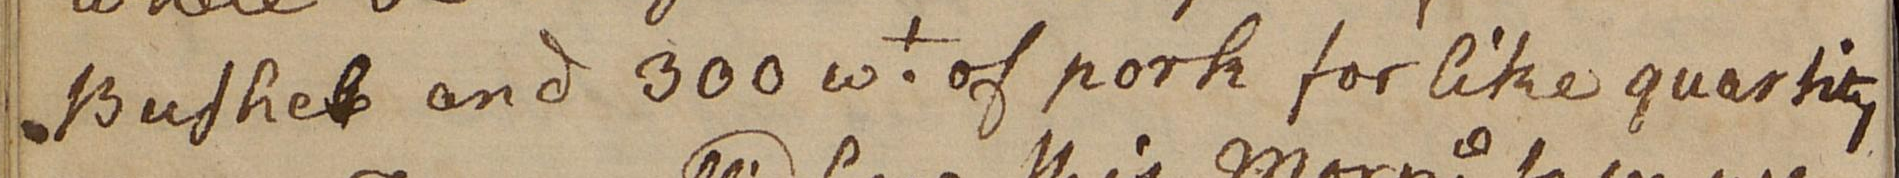Bushel and 300 w^t. of pork for like quartity
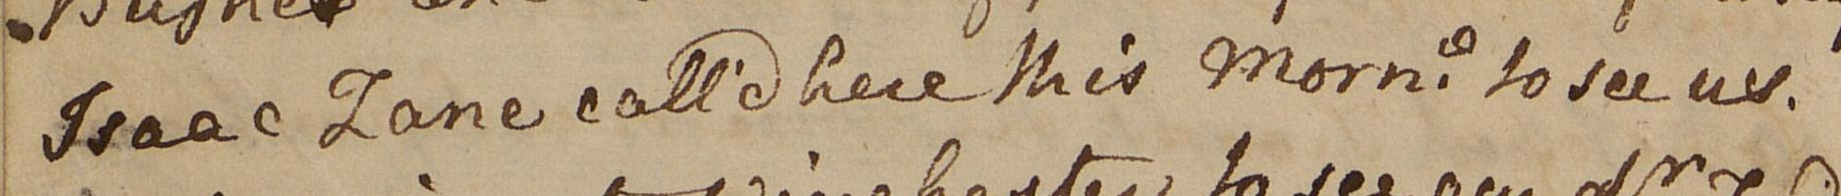Isaac Lane call'd here this Morn^g. to see us.
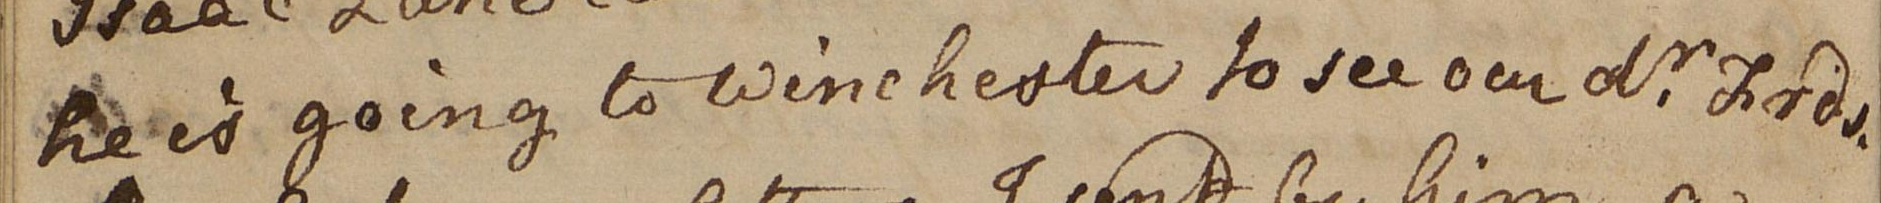he is going to Winchester to see our d^r. Frds.
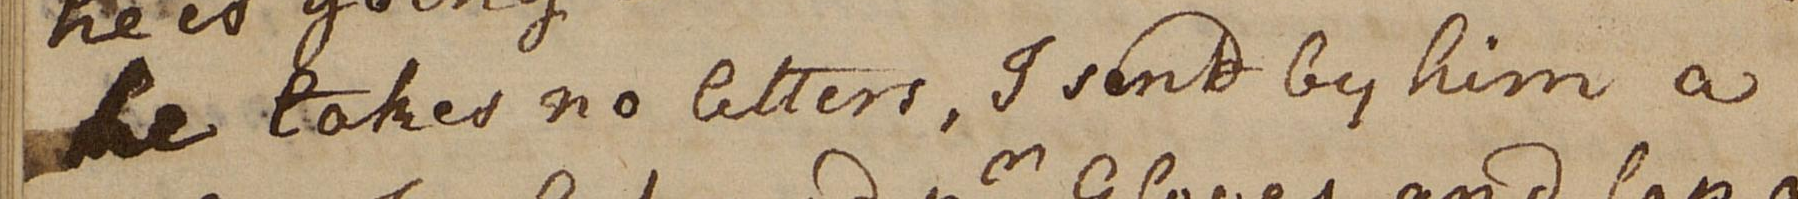he takes no letters, I sent by him a
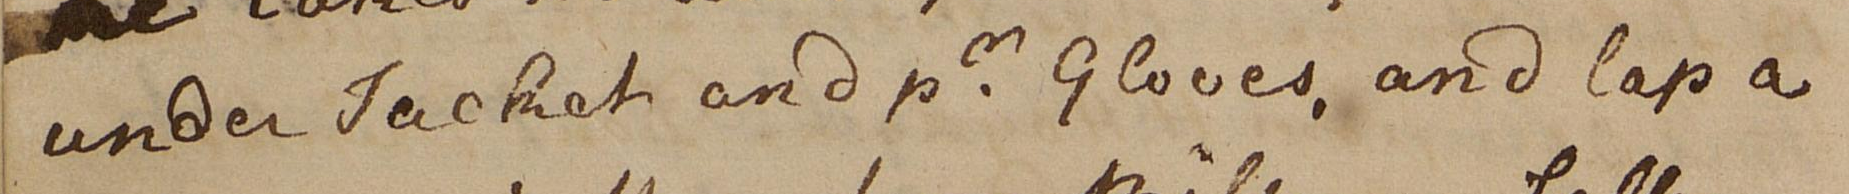under Jacket and p^m. Gloves, and Cap a
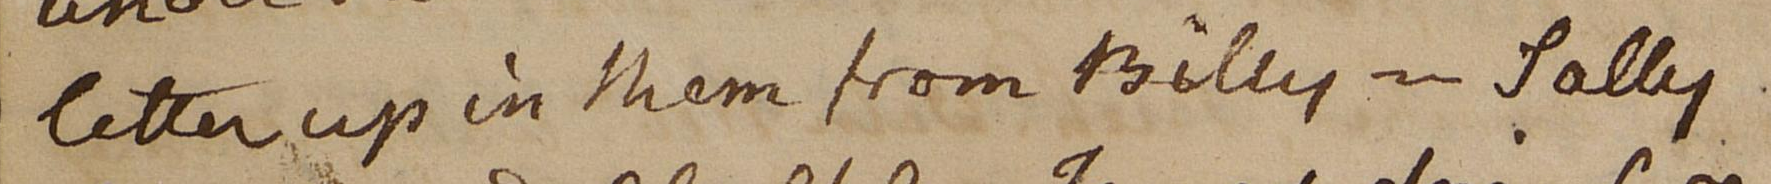letter up in them from Billy- Sally
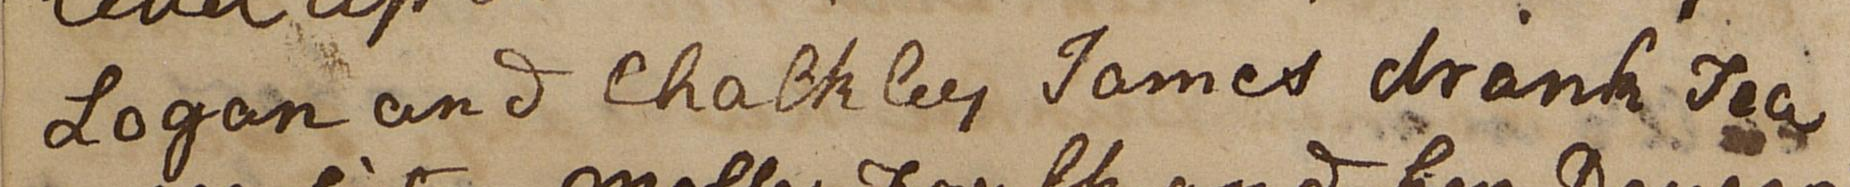Logan and Chalkley James drank Tea
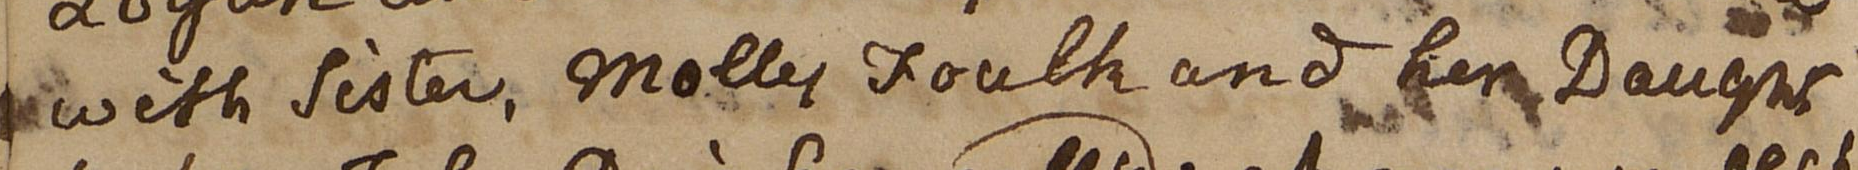with Sister, Molly Foulk and her Daugh^r.
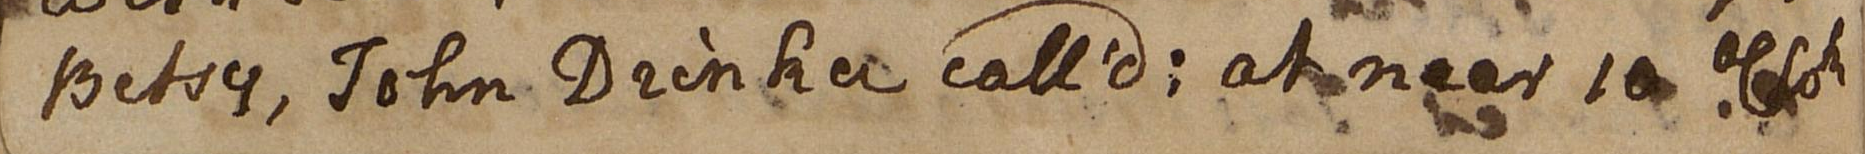Betsy, John Drinker call'd; at near 10 ^oClo^k
